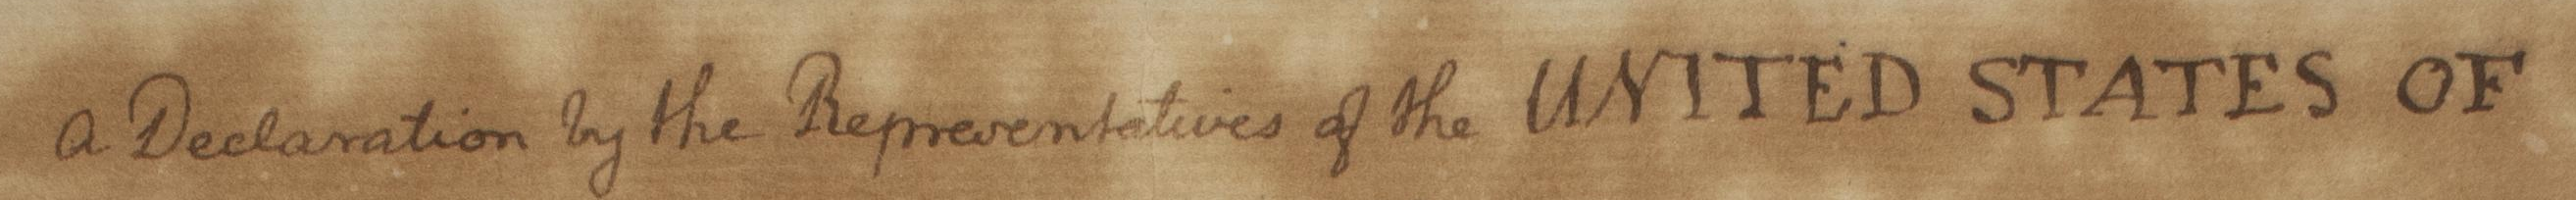a Declaration by the Representatives of the UNITED STATES OF
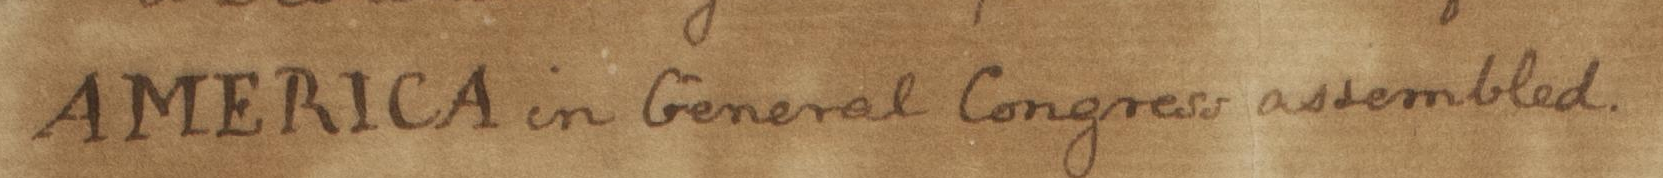AMERICA in General Congress assembled
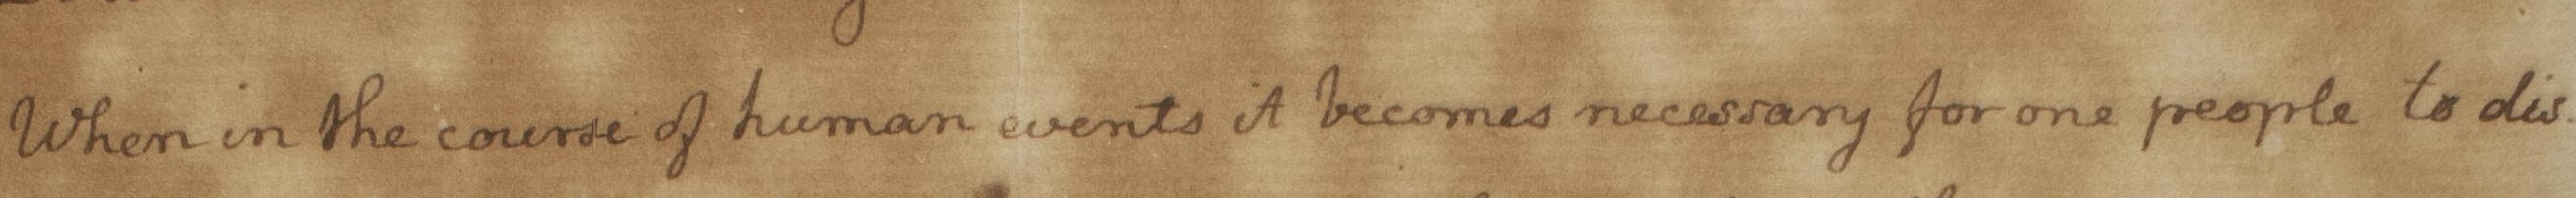When in the course of human events it becomes necessary for one people to dis-
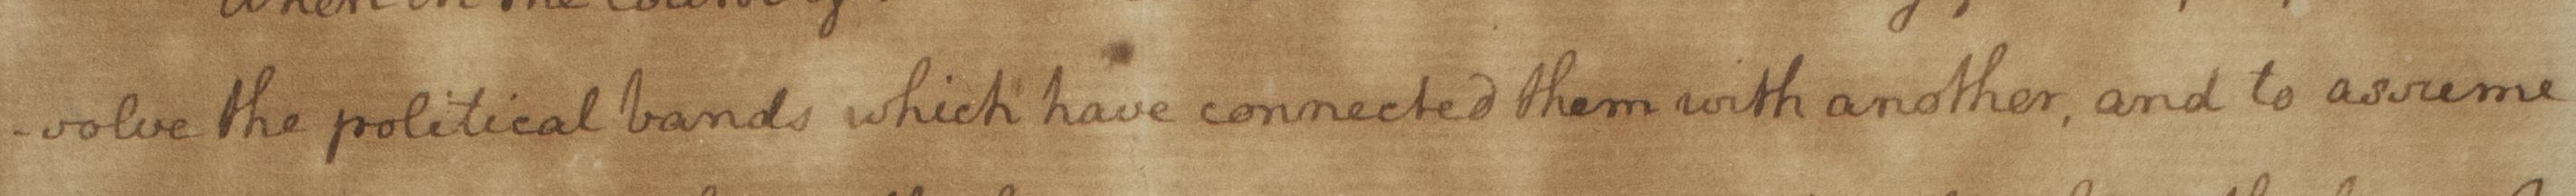-solve the political bands which have connected them with another, and to assume
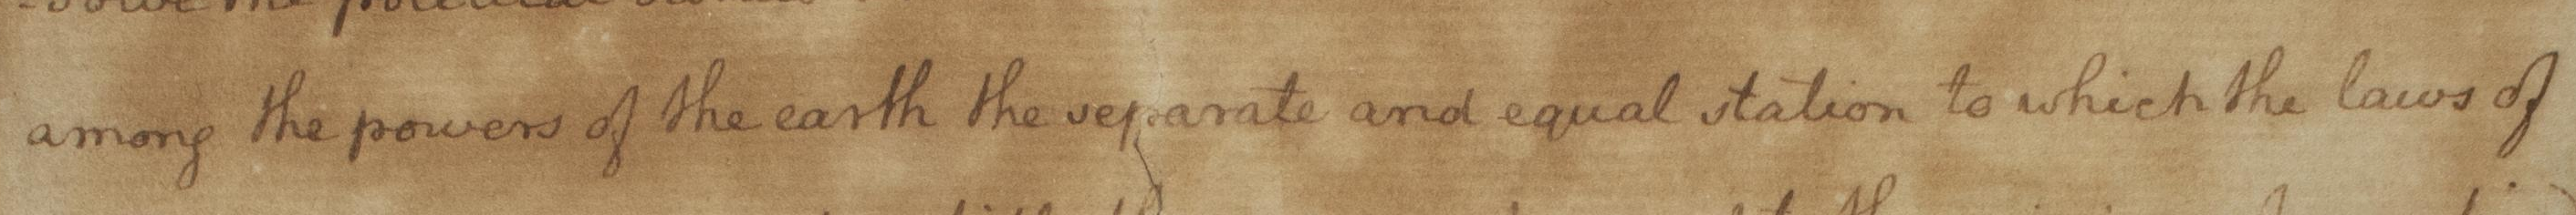among the powers of the earth the separate and equal station to which the laws of
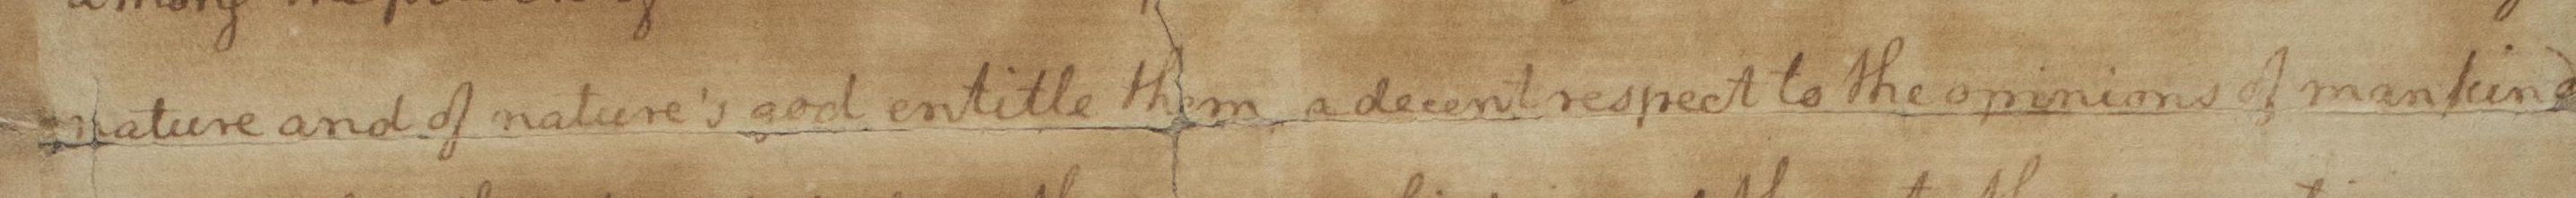nature and of nature's god entitle them, a decent respect to the opinions of mankind
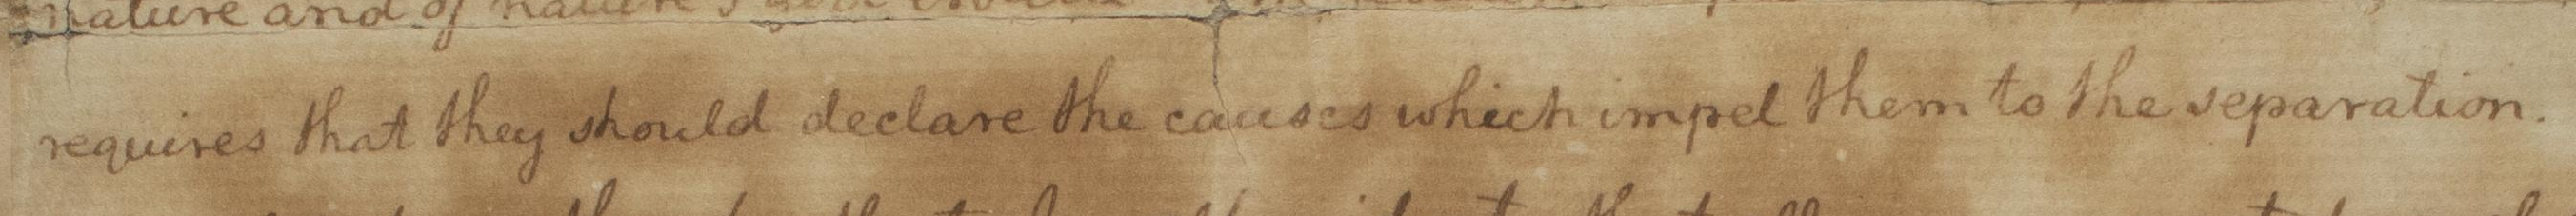requires that they should declare the causes which impel them to the separation
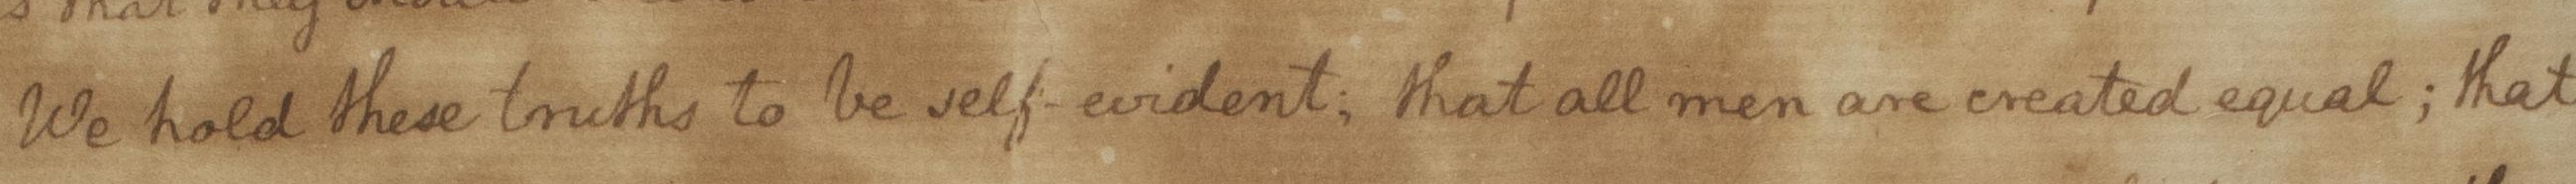We hold these truths to be self evident; that all men are created equal; that
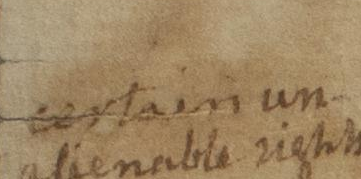certain un-
